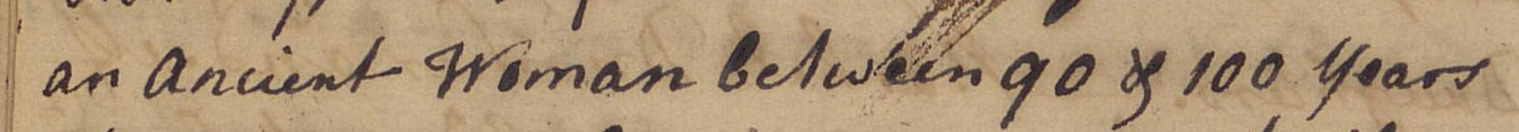an Ancient Woman between 90 & 100 years
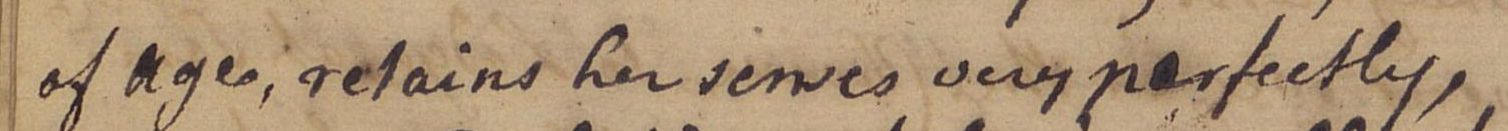of Age, retains her senses very perfectly,
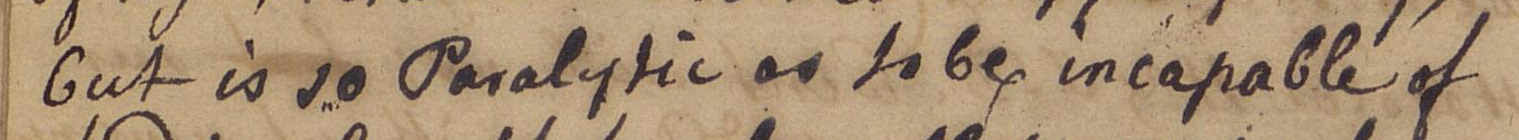but is so Paralytic as to be incapable of
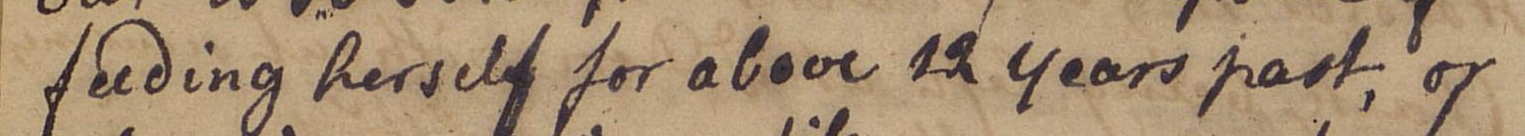feeding herself for above 12 years past, or
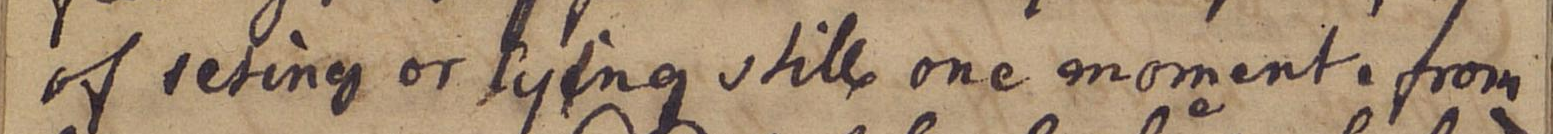of seting or lying still one moments. from
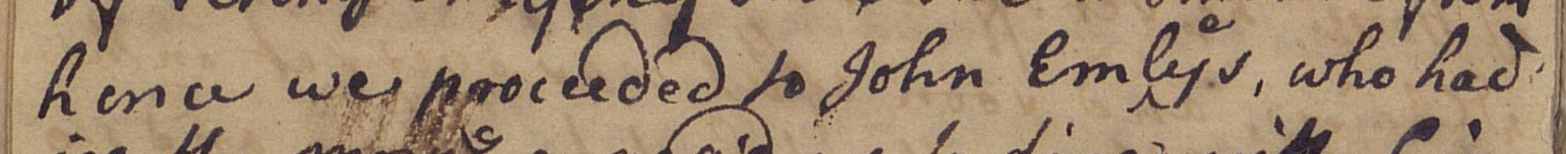hence we proceeded to John Eml^eys, who had
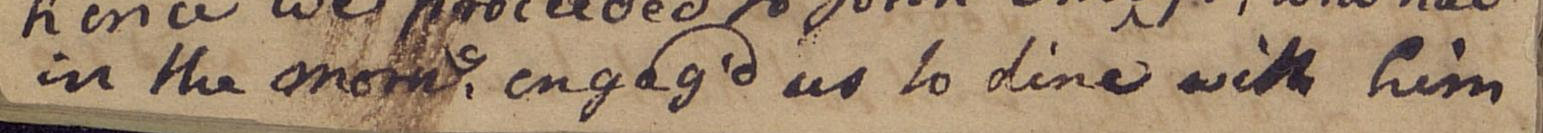in the morn^g. engag'd us to dine with him
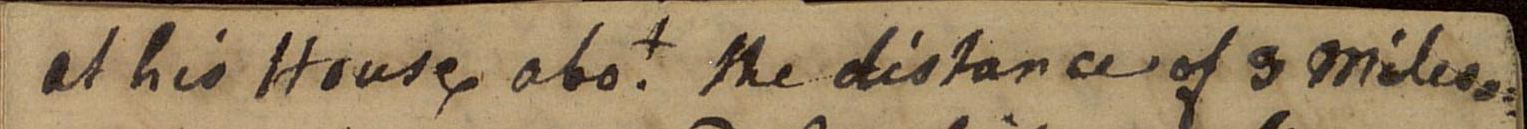at his House abo^t. the distance of 3 Miles
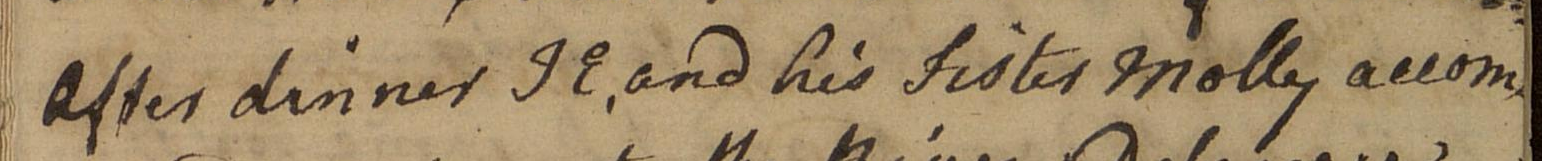After dinner I E, and his Sister Molly accom
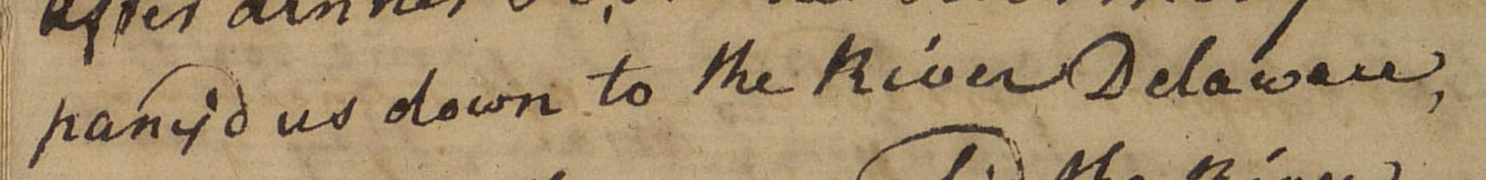pany'd us down to the River Delaware,
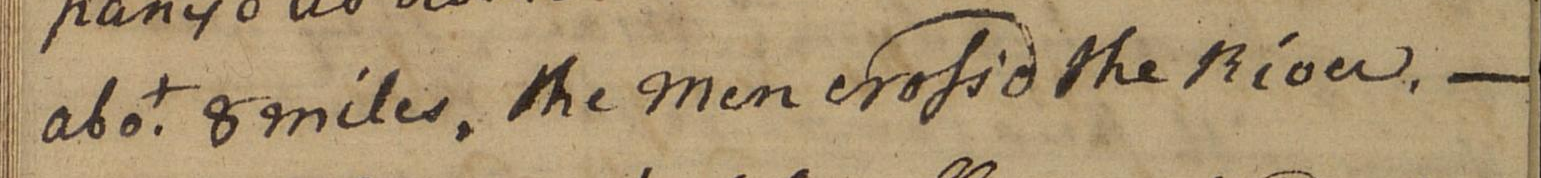abo^t. 8 miles, the men cross'd the River,-
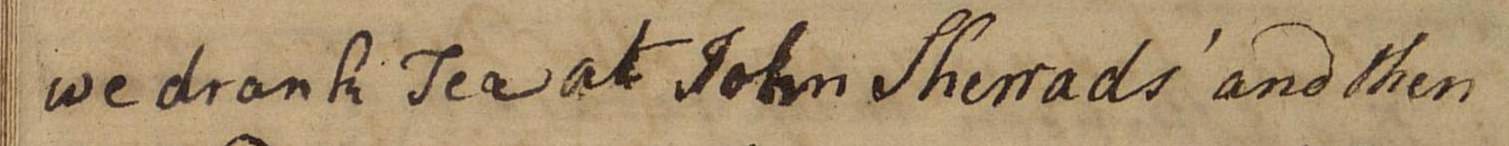we drank Tea at John Sherrads' and then
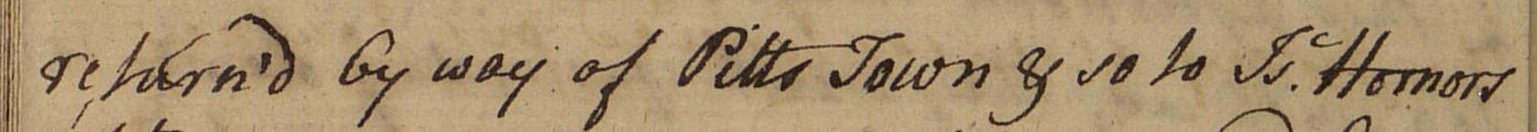return'd by way of Pitts Town & so to Is^c. Hornors
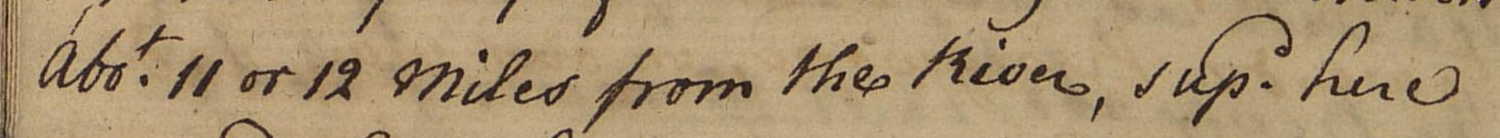abo^t. 11 or 12 Miles from the River, sup^d. here
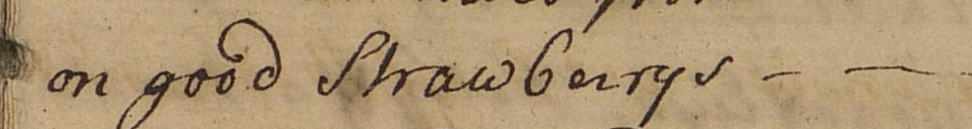on good Strawberrys-
